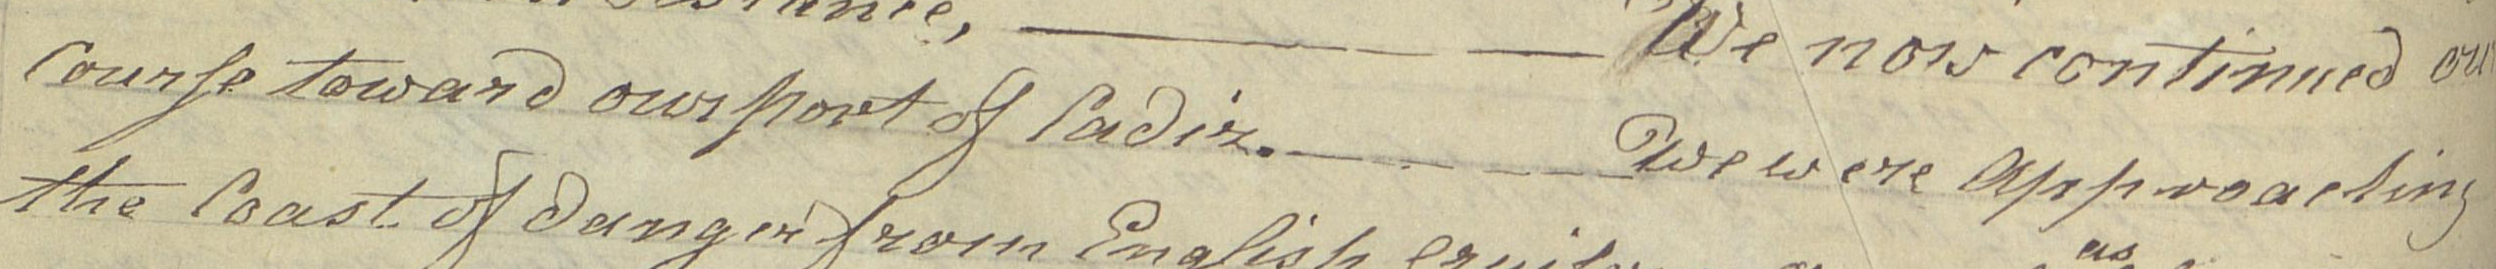Course toward our port of Cadiz. We were approaching
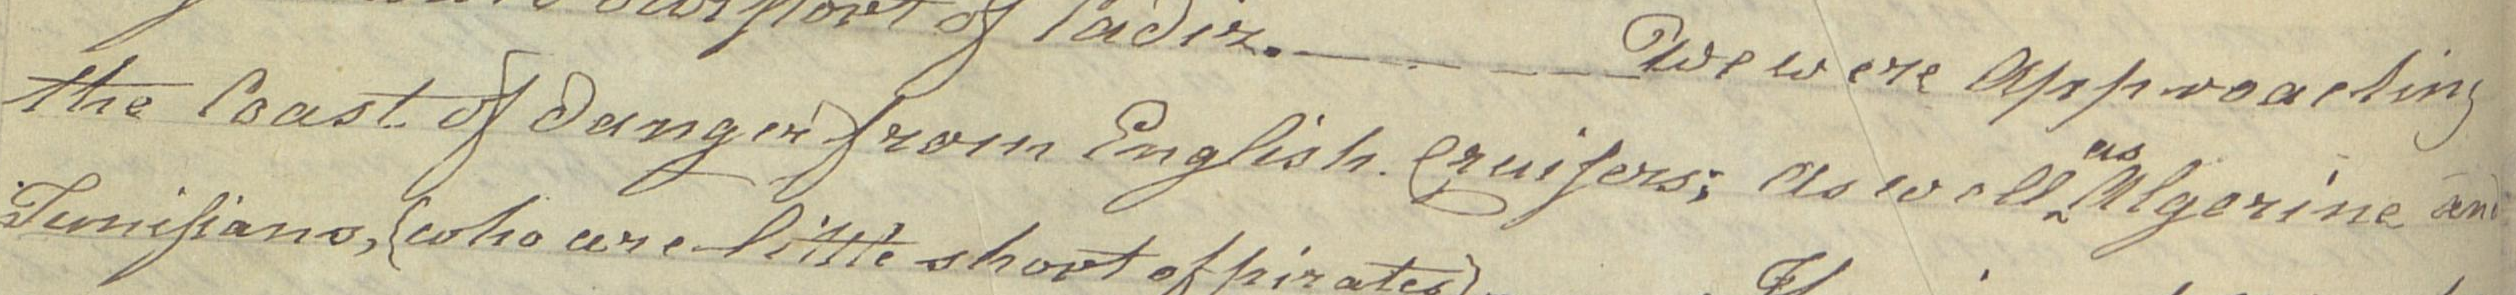the Coast of danger from English Cruisers; as well ^ Algerine and
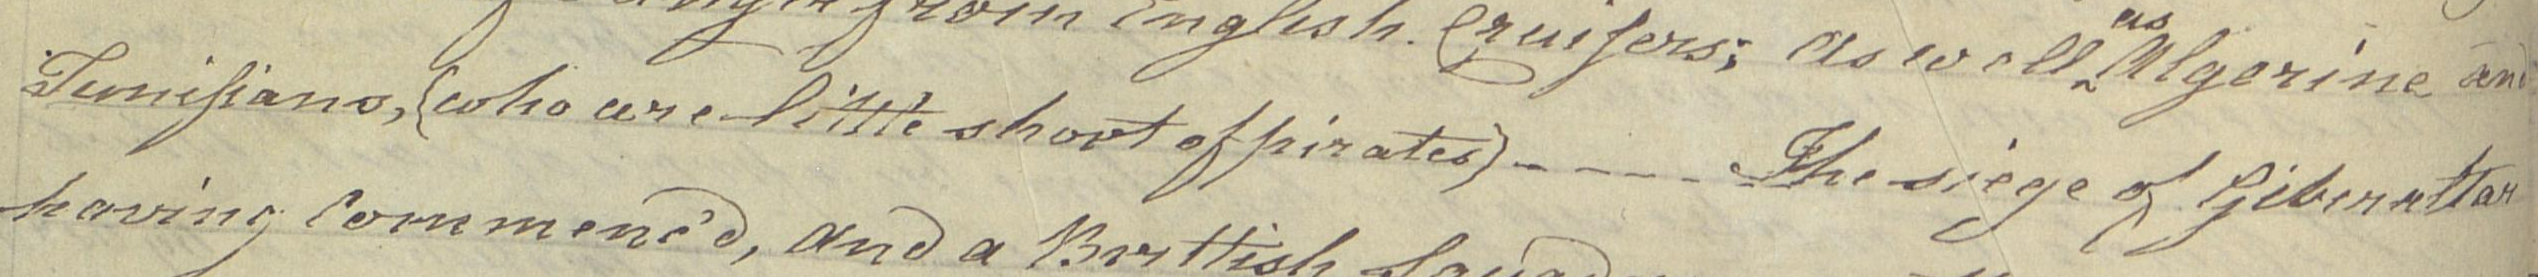Tunisians, (who are little short of pirates) The siege of Giberaltar
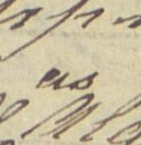as
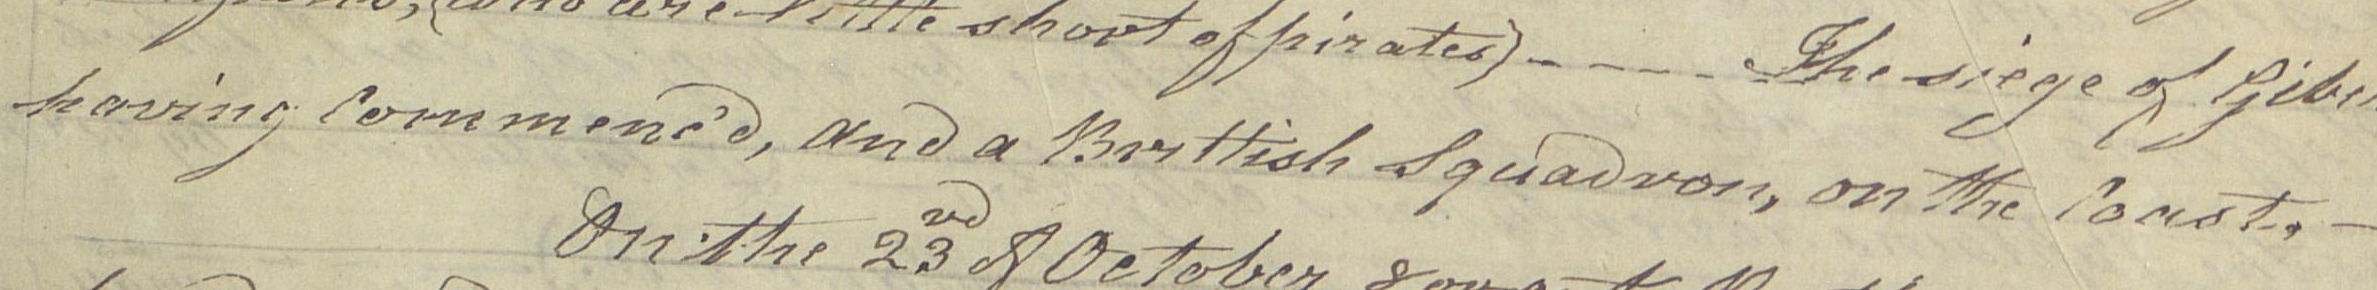having commenc'd, and a Brittish Squadron, on the Coast.
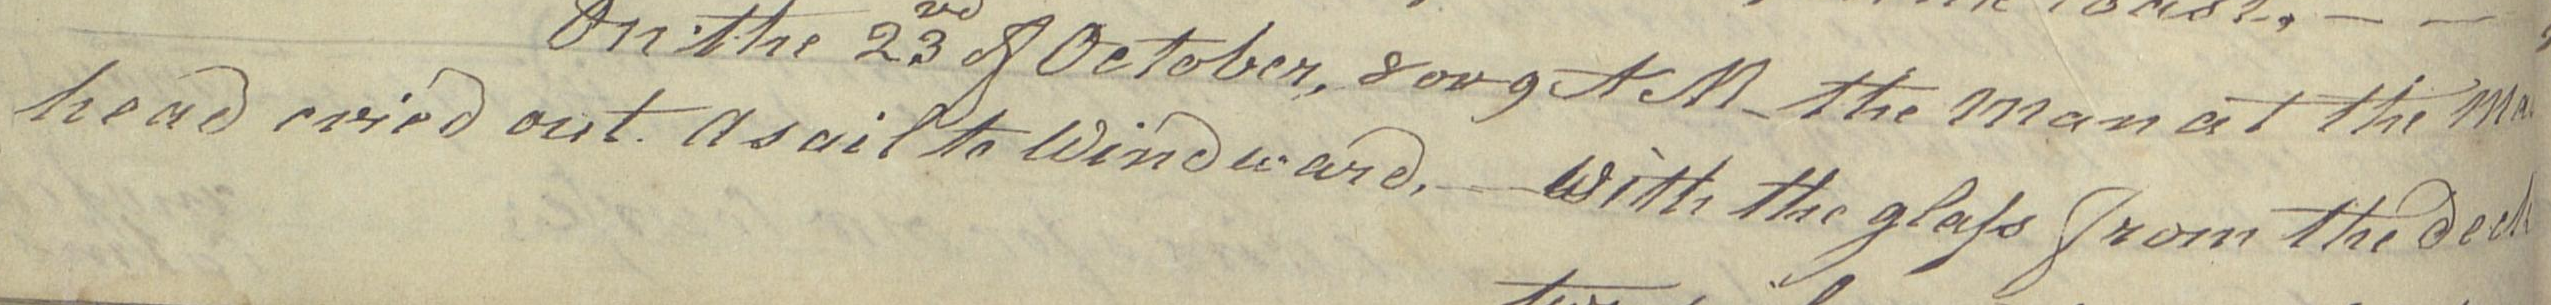head cried out asail to Windward, With the glass from the deck
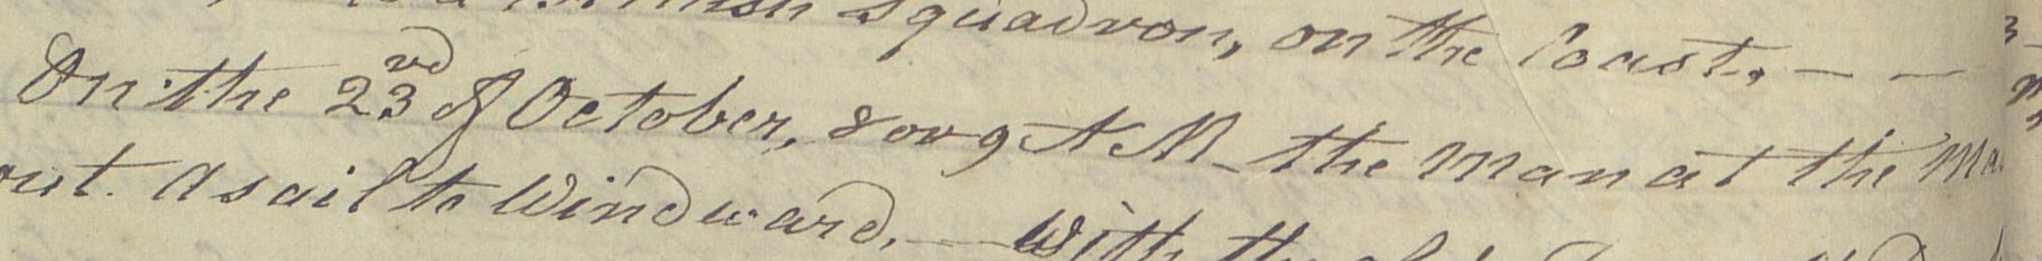On the 23d of October, 8 or 9 AM the man at the ma-
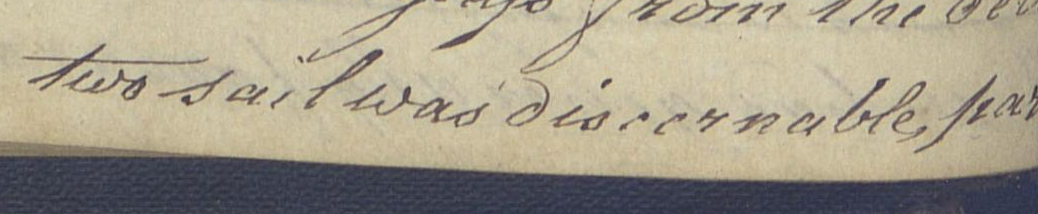two sail was discernable, par-
